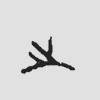出
